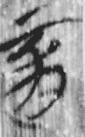亥
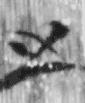之
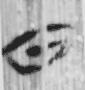日
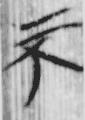不
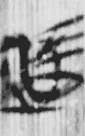𬨭（將）
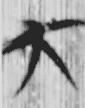大
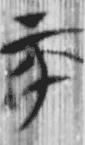帀（師）
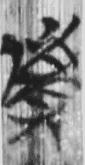儥
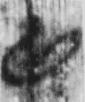㠯（以）
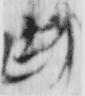○（廷）
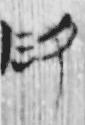阩
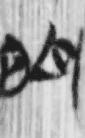門
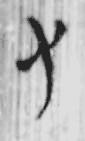又
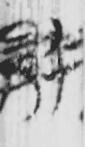敗
